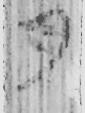月
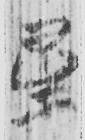星
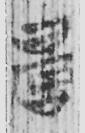晨
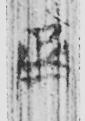甬
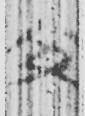交
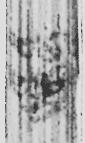{𤔔㗊}（亂）
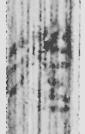進
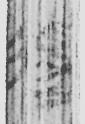退
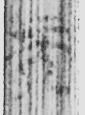而
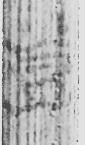莫
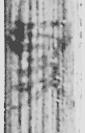𠭁（得）
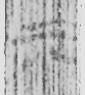亓
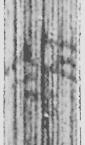𠂔
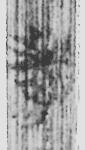歲
